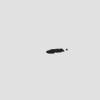一
